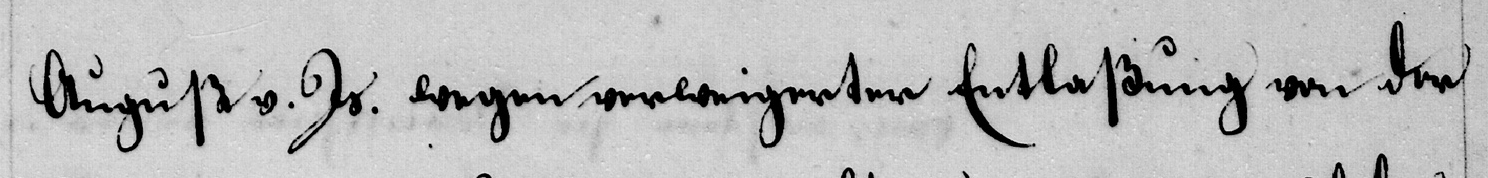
August v. Js. wegen verweigerter Entlaßung von der
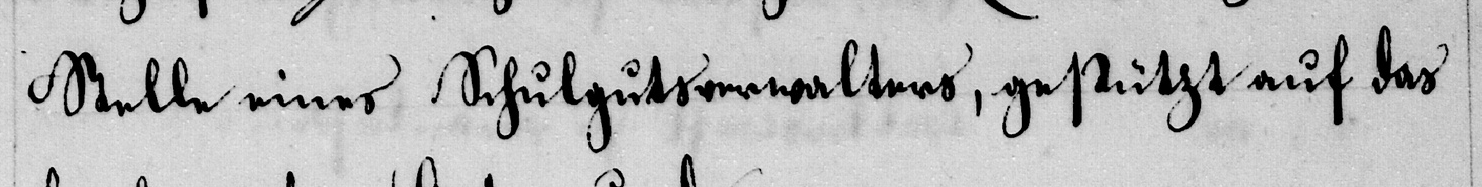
Stelle eines Schulgutsverwalters, gestützt auf das
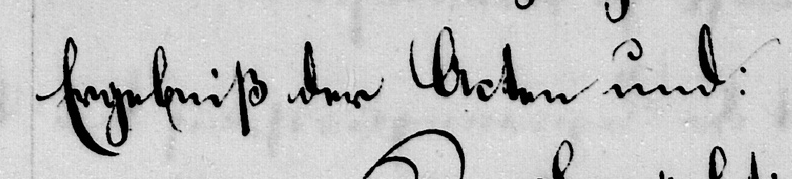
Ergebniß der Acten und:
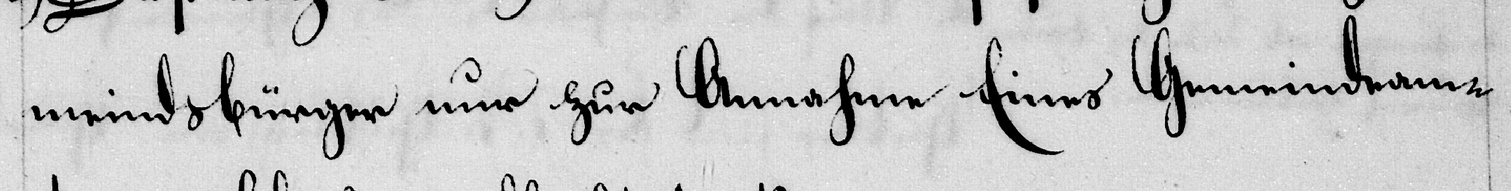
meindsbürger nur zur Annahme Eines Gemeindeamtes
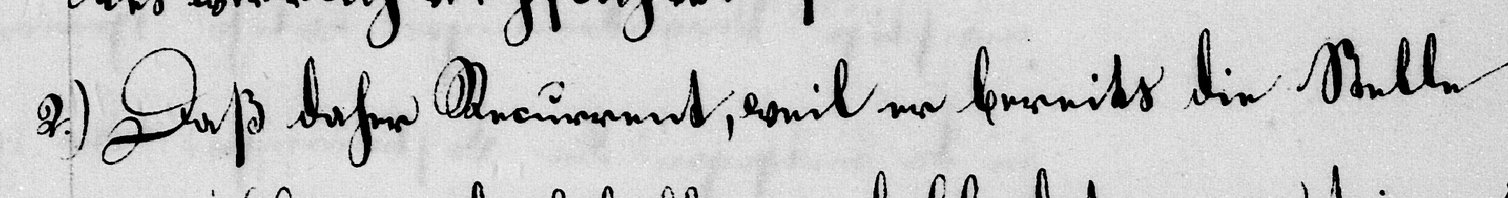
2.) Daß daher Recurrent, weil er bereits die Stelle
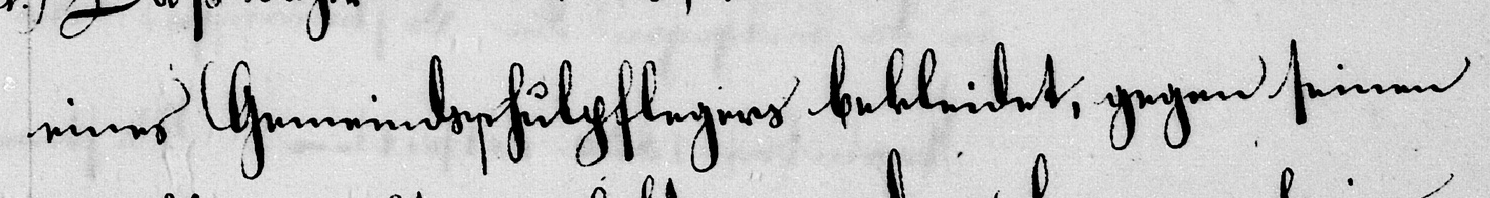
eines Gemeindsschulpflegers bekleidet, gegen seinen
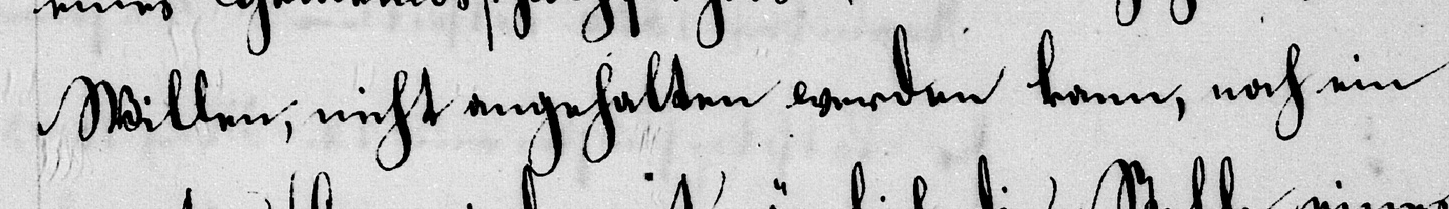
Willen, nicht angehalten werden kann, noch ein
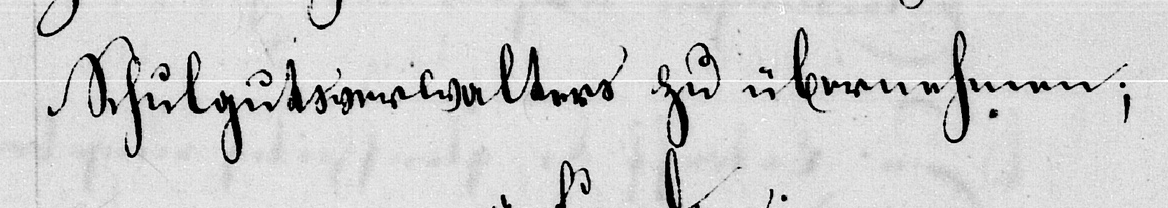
Schulgutverwalters zu übernehmen;
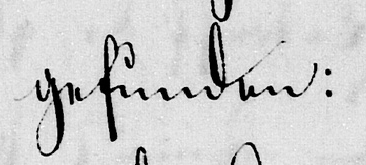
gefunden:
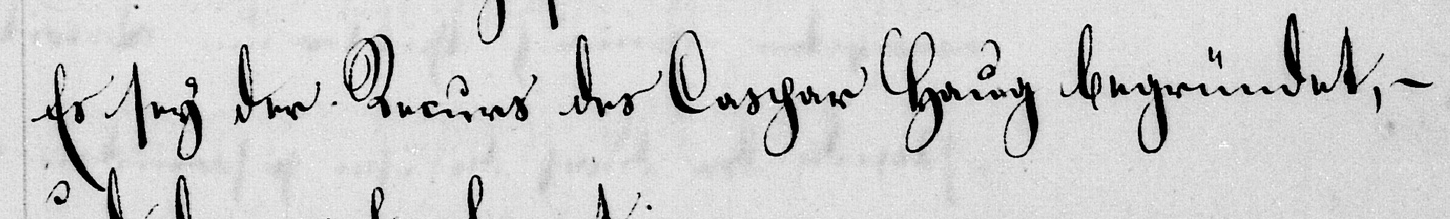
Es sey der Recurs des Caspar Haug begründet, –
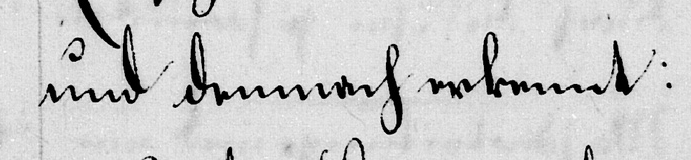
und demnach erkennt:
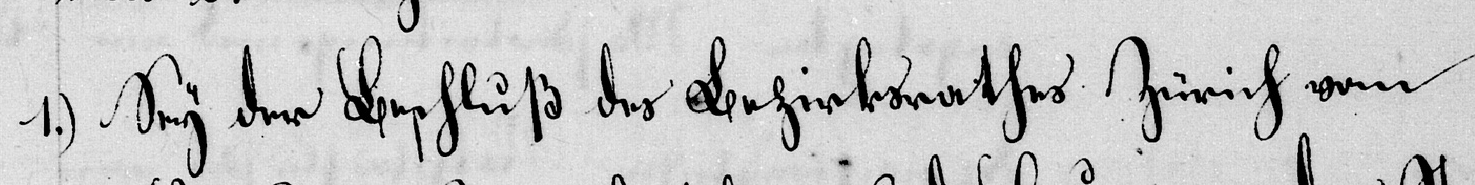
1.) Sey der Beschluß des Bezirksrathes Zürich vom
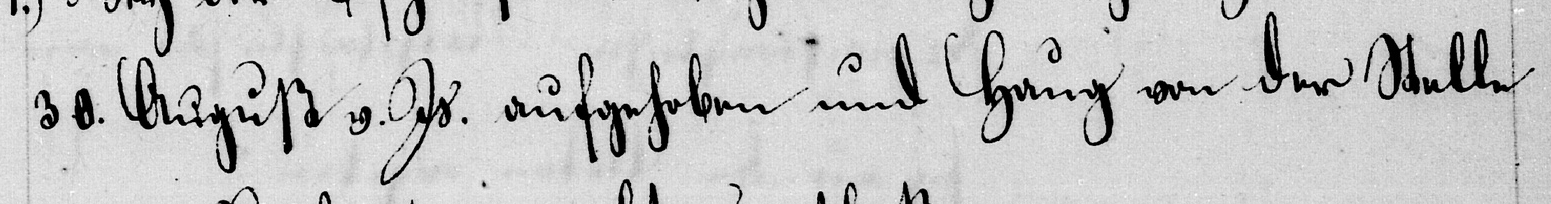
30. August v. Js. aufgehoben und Haug von der Stelle
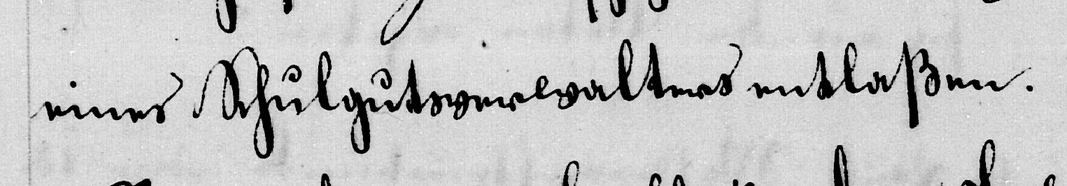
eines Schulgutsverwalters entlaßen.
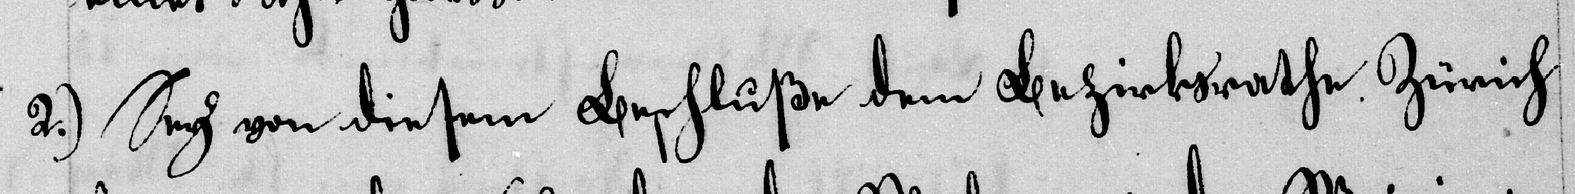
2.) Sey von diesem Beschluße dem Bezirksrathe Zürich
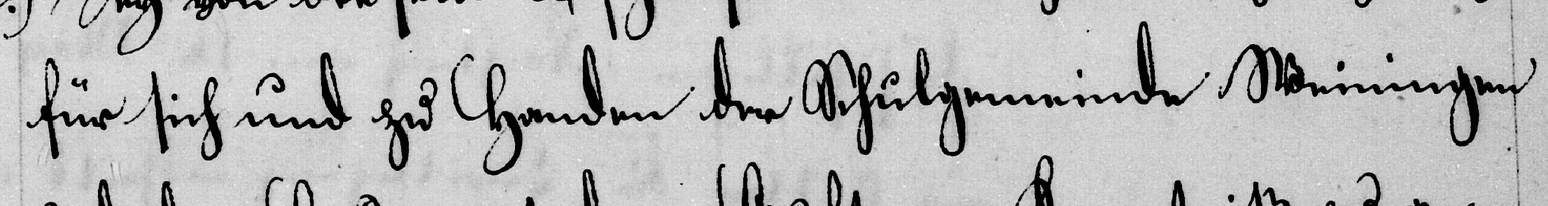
für sich und zu Handen der Schulgemeinde Weiningen
